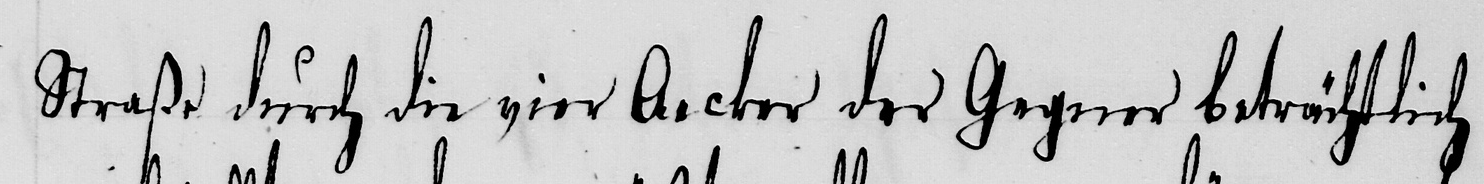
Straße durch die vier Aecker der Gegner beträchtlich
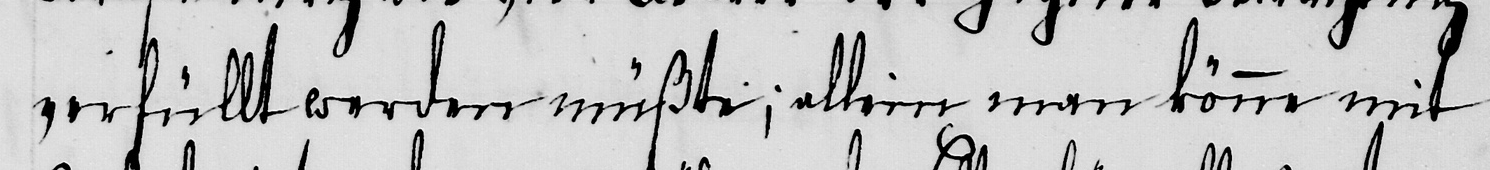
verfüllt werden müßte; allein man könne mit
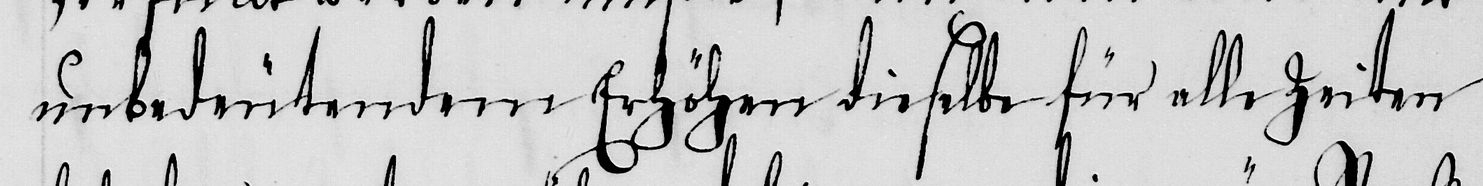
unbedeutendem Erhöhen dieselbe für alle Zeiten
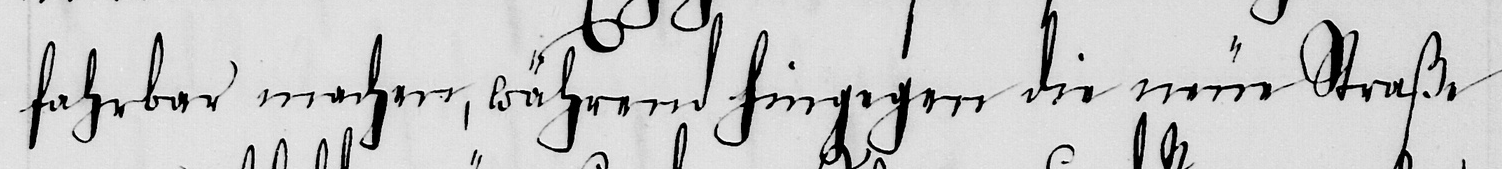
fahrbar machen, während hingegen die neue Straße
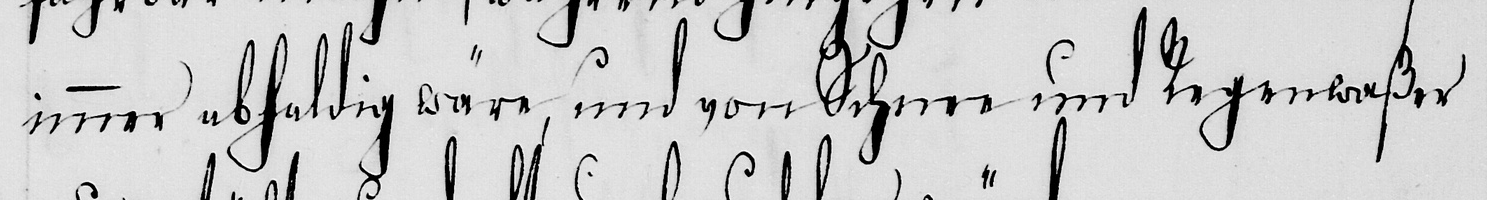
immer abhaldig wäre, und von Schnee und Regenwaßer
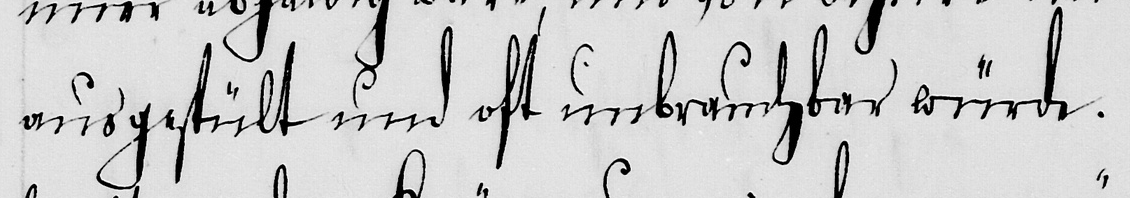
ausgespült und oft unbrauchbar würde.
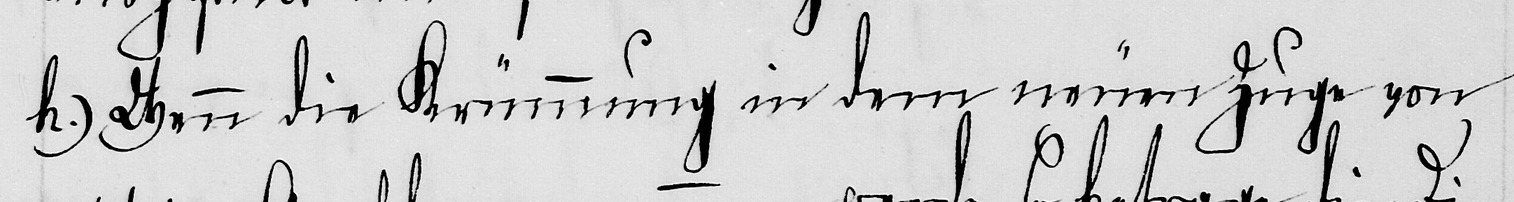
h.) Wenn die Krümmung in dem neuen Zuge von
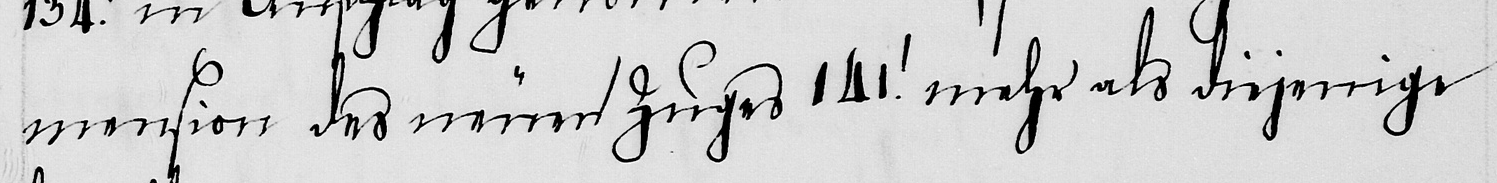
mension des neuen Zuges 141 [Fuss]. mehr als diejenige
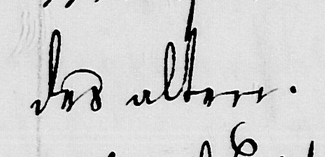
des alten.
